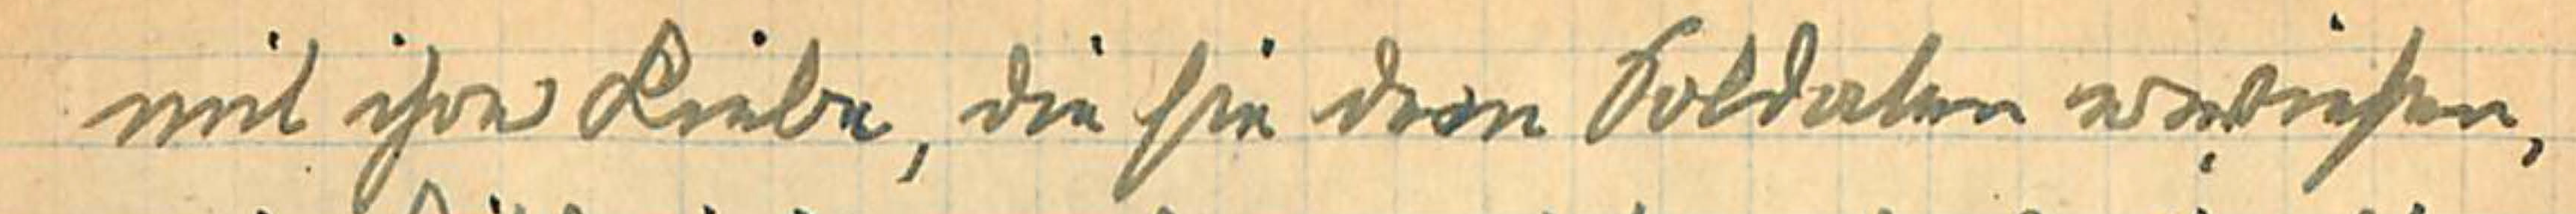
mit ihrer Liebe, die sie den Soldaten erwiesen,
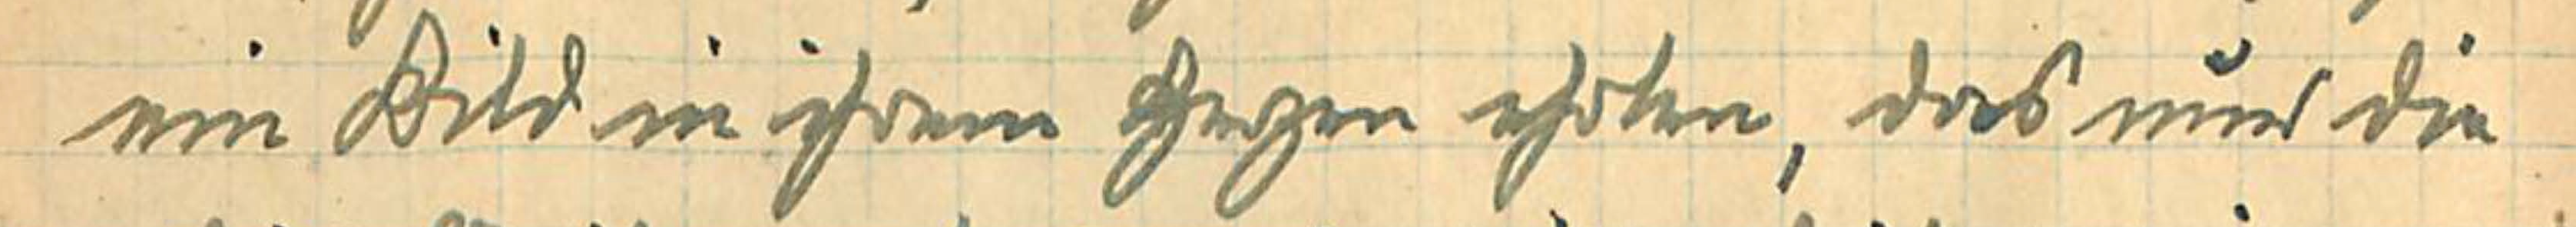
ein Bild in ihrem Herzen ehrten, das nur die
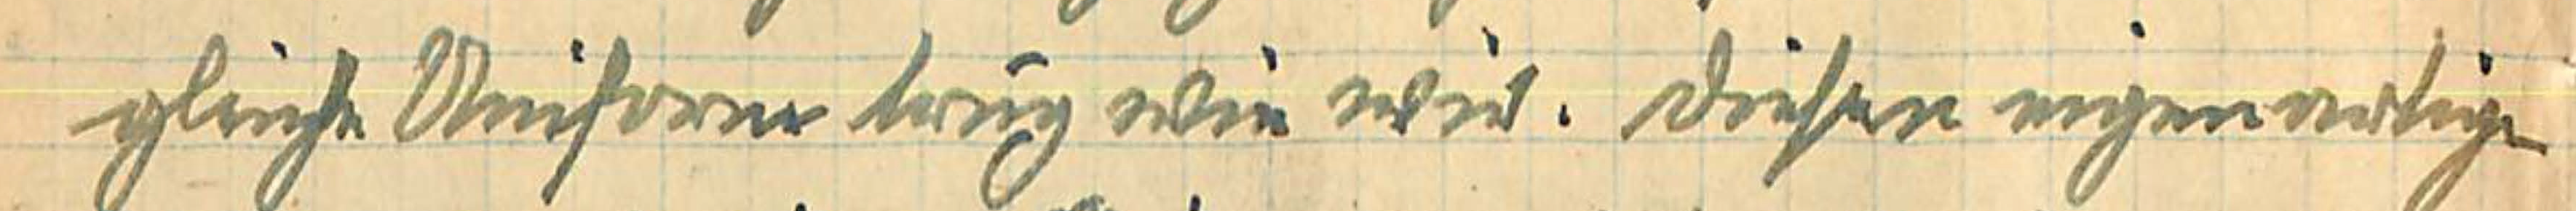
gleiche Uniform trug wie wir. Diesen eigenartigen
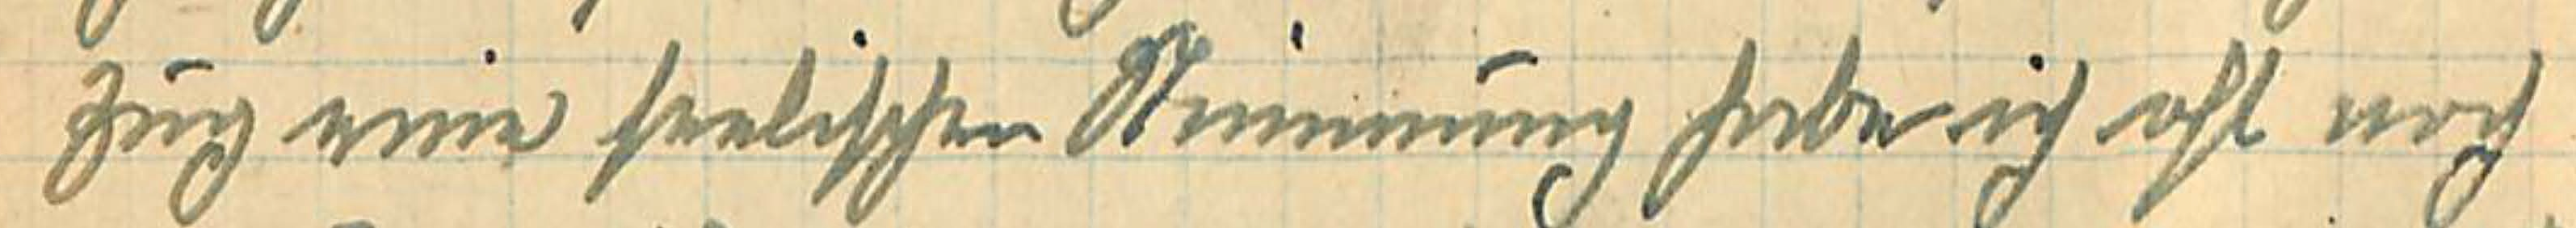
Zug einer seelischen Stimmung habe ich oft noch
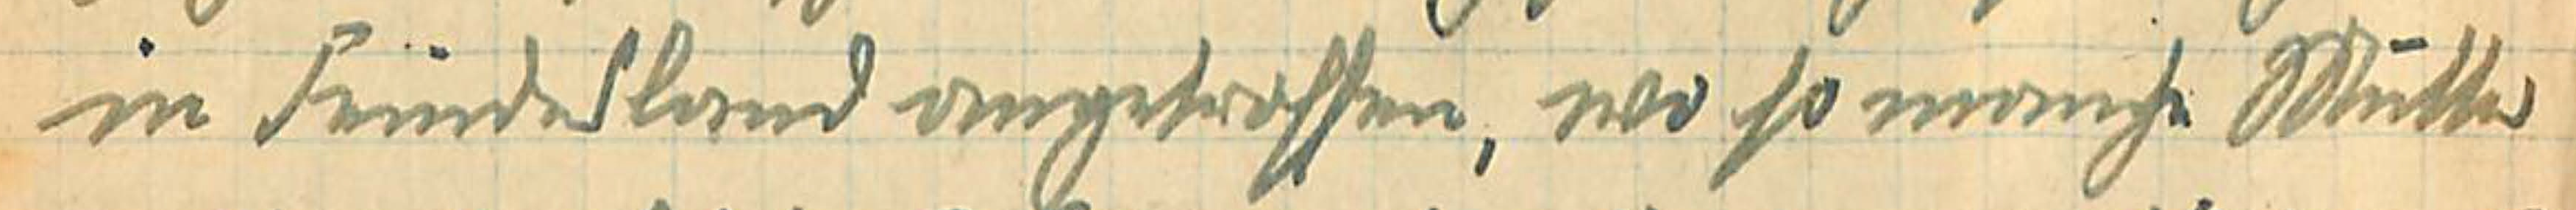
in Feindesland angetroffen, wo so manche Mutter
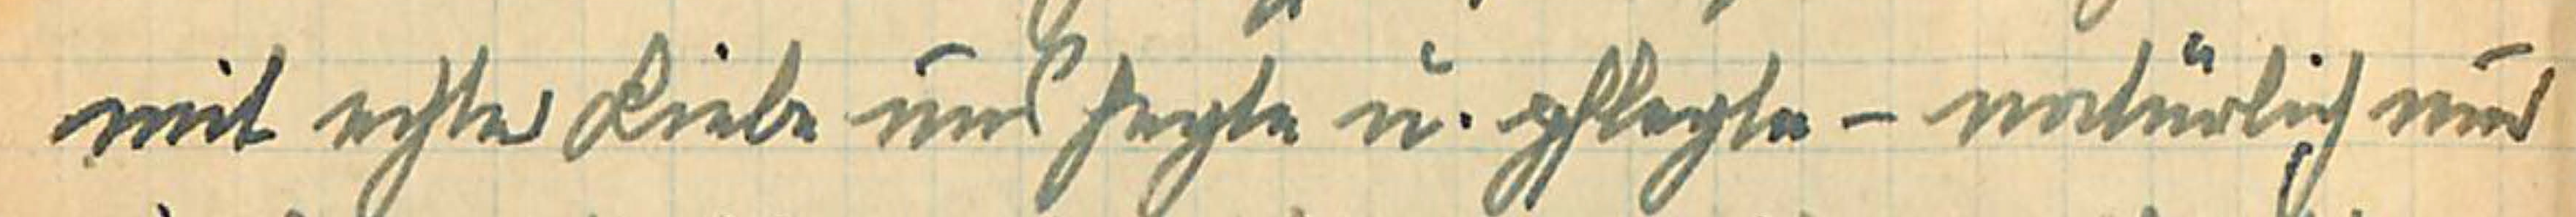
mit echter Liebe uns hegte u. pflegte – natürlich nur
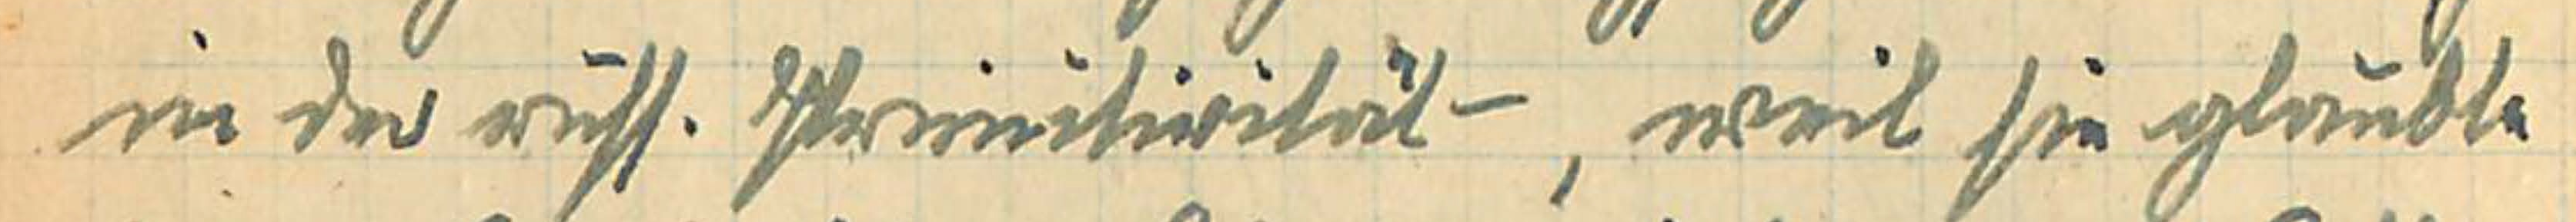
in der russ. Primitivität –, weil sie glaubte
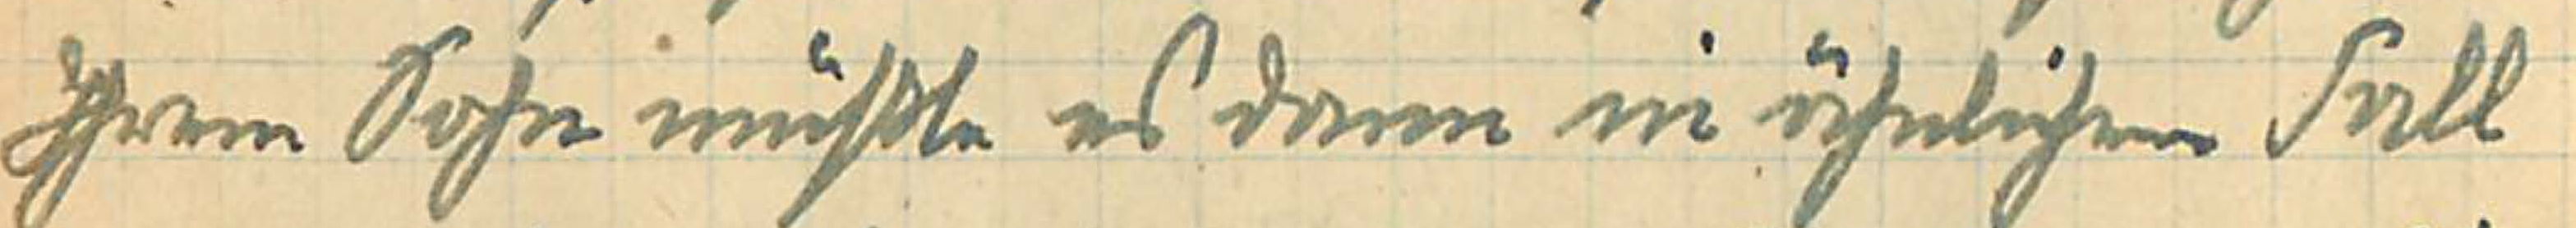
Ihrem Sohn müßte es dann in ähnlichem Fall
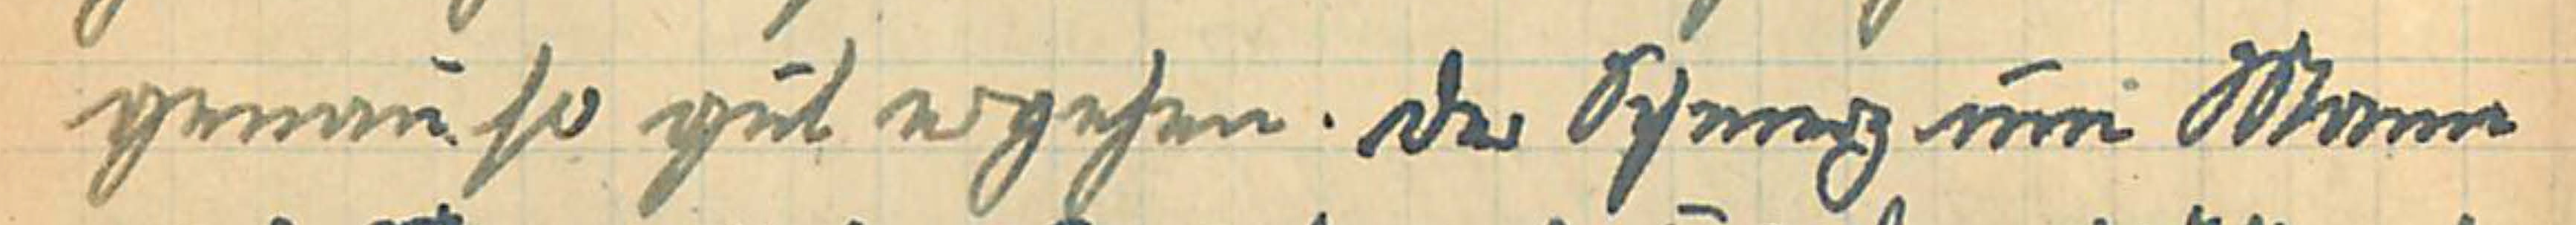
genauso gut ergehen. Der Schmerz um Mann
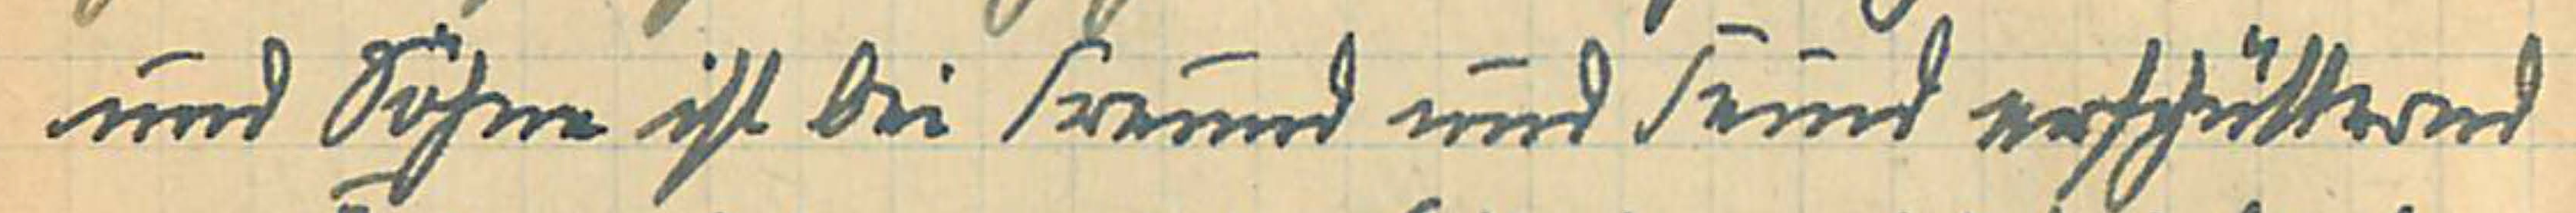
und Söhne ist bei Freund und Feind erschütternd
